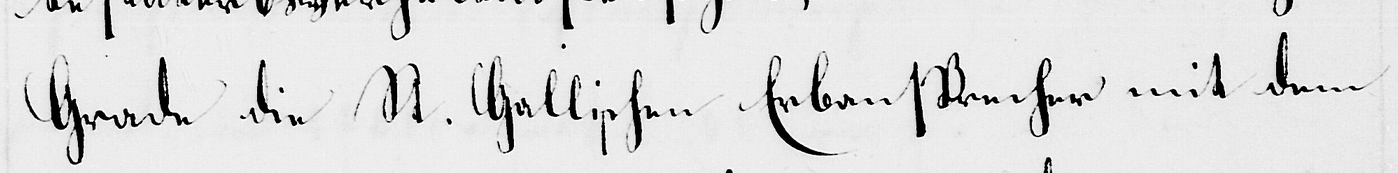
Grade die St. Gallischen Erbansprecher mit dem
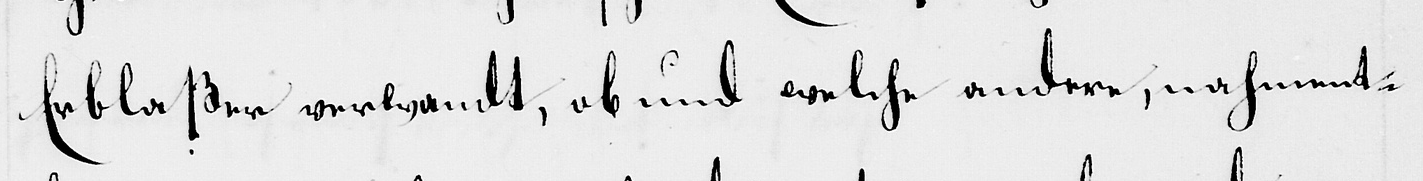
Erblaßer verwandt, ob und welche andern, nahment¬
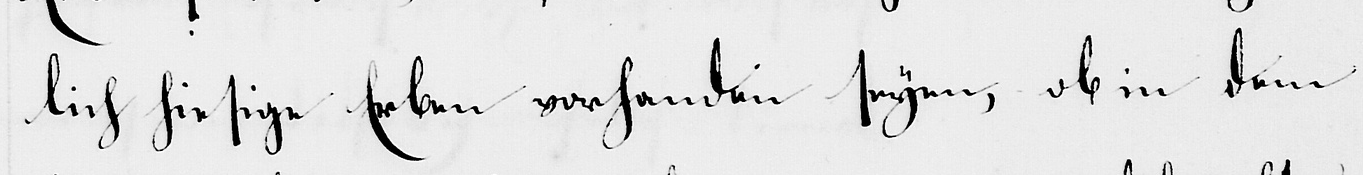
lich hiesige Erben vorhanden seyen, ob in dem
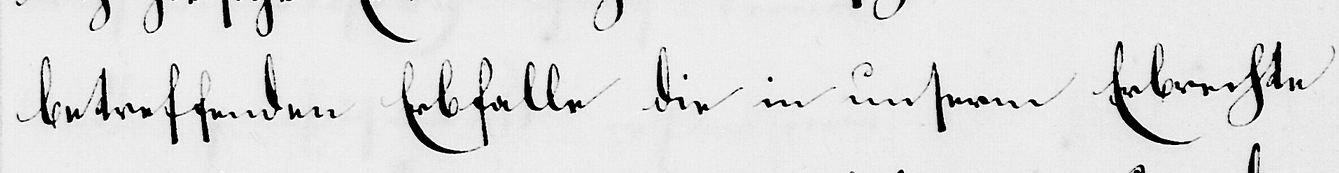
betreffenden Erbfalle die in unserm Erbrechte
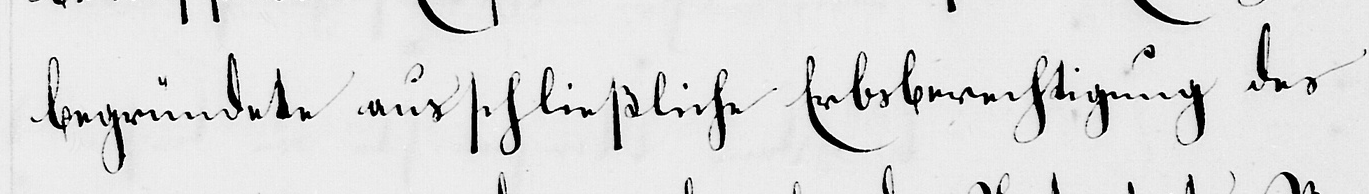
begründete ausschließliche Erbsberechtigung des
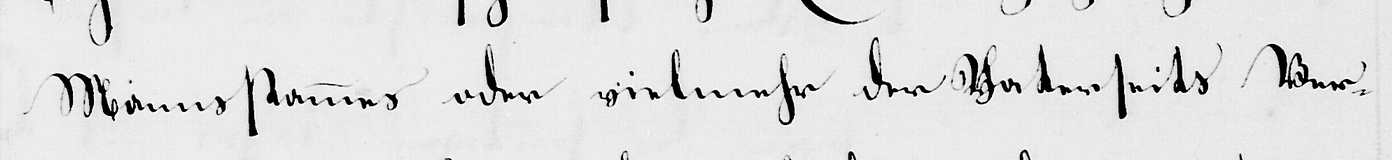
Mannsstammes oder vielmehr der Vaterseits Ver¬
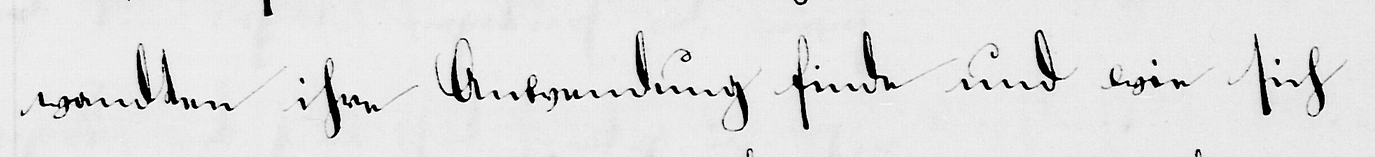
wandten ihre Anwendung finde und wie sich
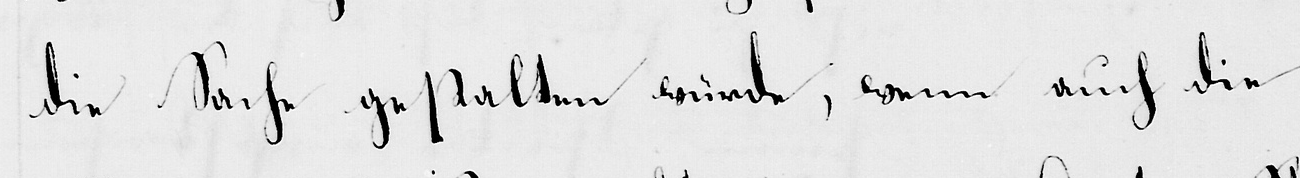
die Sache gestalten würde, wenn auch die
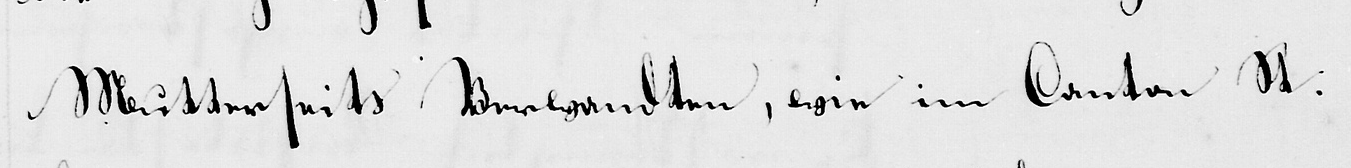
Mutterseits Verwandten, wie im Canton St.
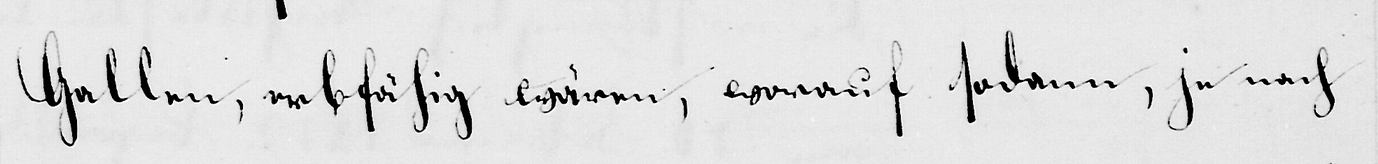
Gallen, erbfähig wären, worauf sodann, je nach
